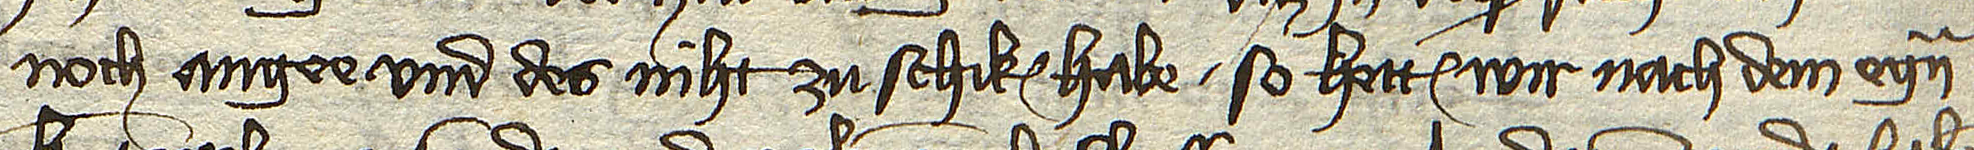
noch angee vnd des niht ʒu ſchik* habe / ſo hett* wir nach dem eg*n
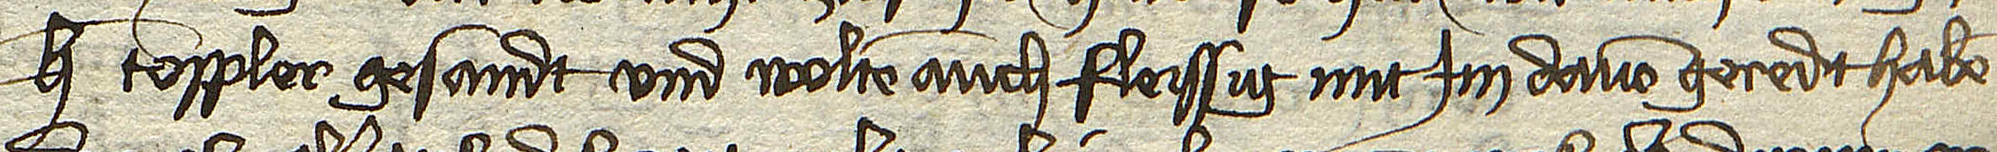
h* toppler geſandt vnd wolte* auch fleiſſig mit Im dauo* geredt habe*
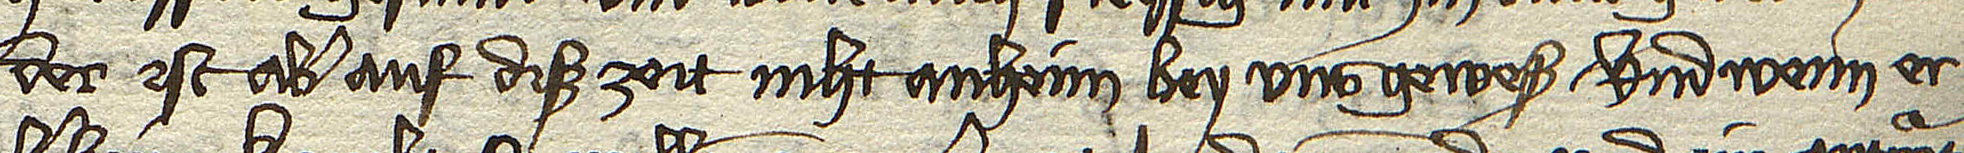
Der iſt ab* auf diſʒ ʒeit niht anheim bey vns geweſ* / Vnd wenn er
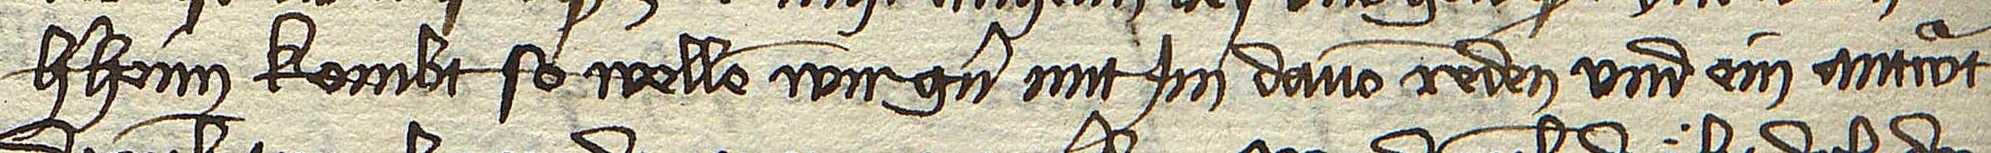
h* heim kombt ſo welle* wir g*n mit Im dauo* reden vnd ein antw*t
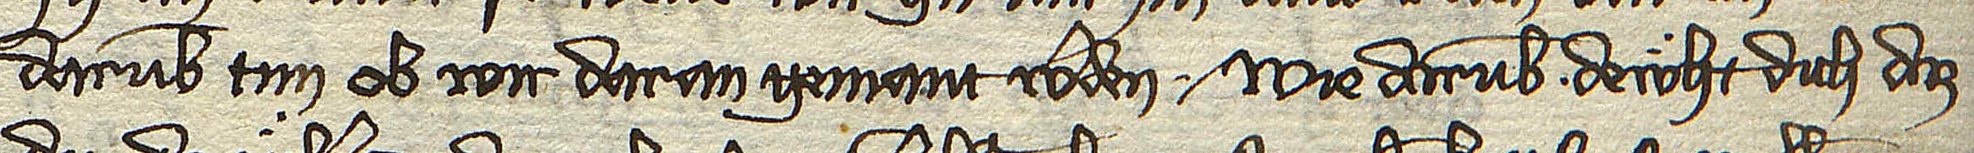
darüb* tun ob wir daran gemant w*den . Wie darub* . deẅht dich daʒ
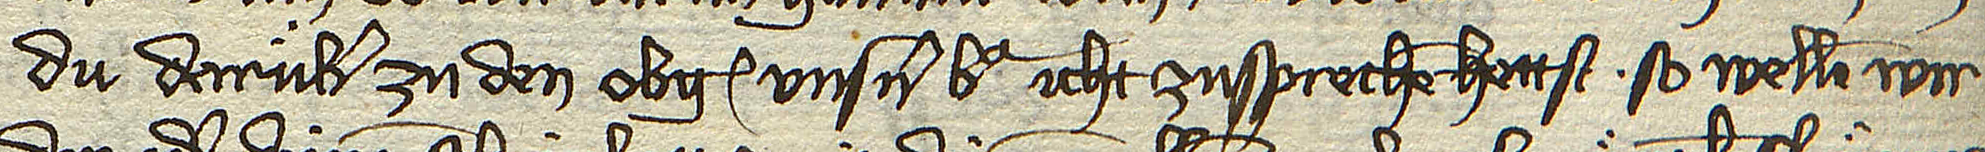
du darüb* ʒu den obg* vnſ*n b* icht ʒuſpreche* hettſt . ſo welle* wir
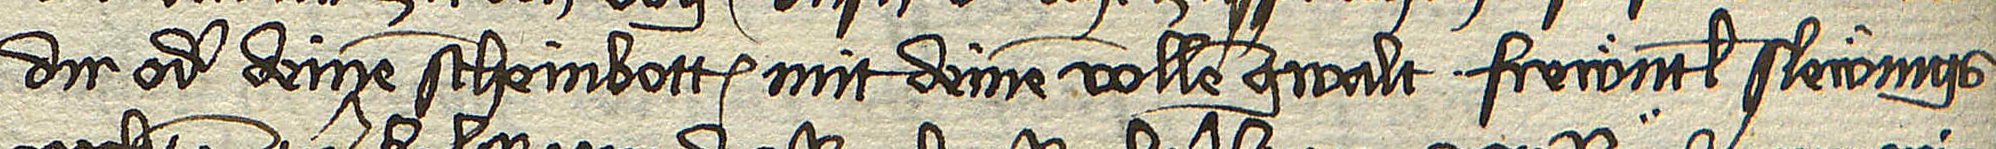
dir od* deine* ſcheinbott* mit deine* volle* gwalt . freẅntl* ſleẅnigs
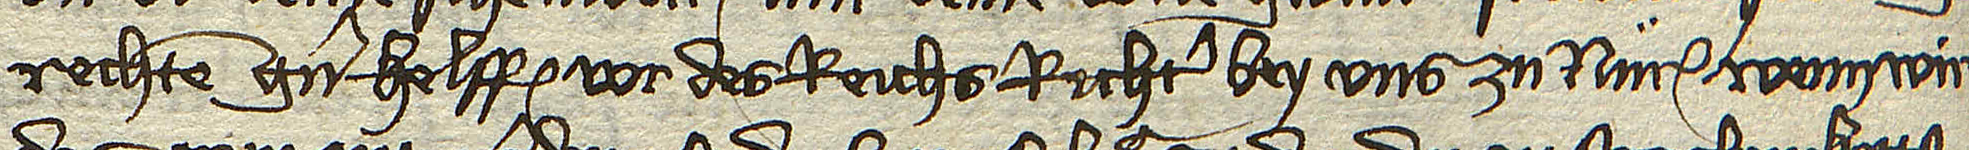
rechte* g*n helff* vor des Reichs Richt* bey vns ʒu Nür* wenn wir
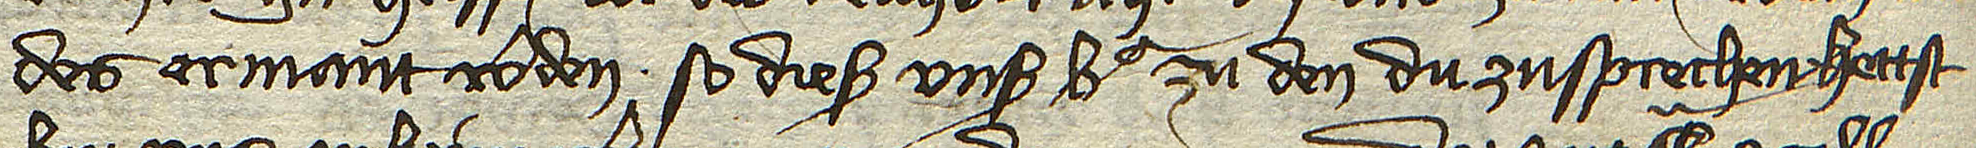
des ermant w*den . ſo dieſ* vnſ* b* ʒu den du ʒuſprechen hettſt
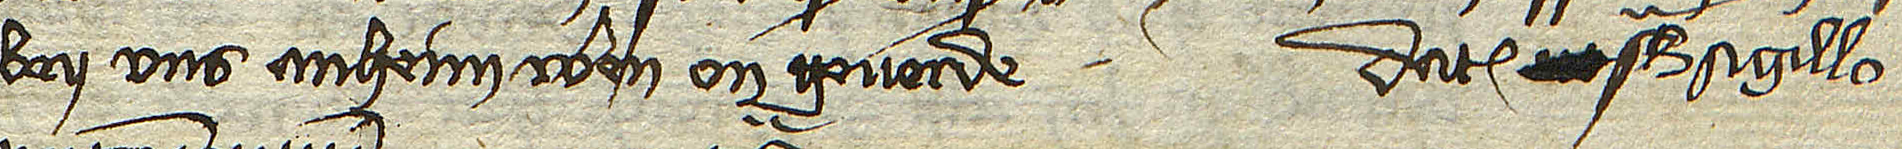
bey vns anheim w*en on geuerde Dat* ut ſ*b ſigillo
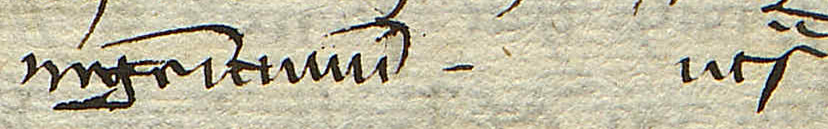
m*gr ciuiu* . ut ſ*
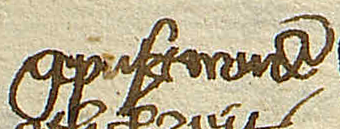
gepuſʒt worde*
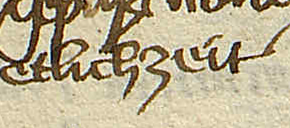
etlich ʒeit
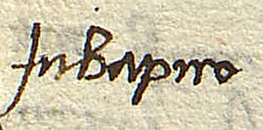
In bapiro
